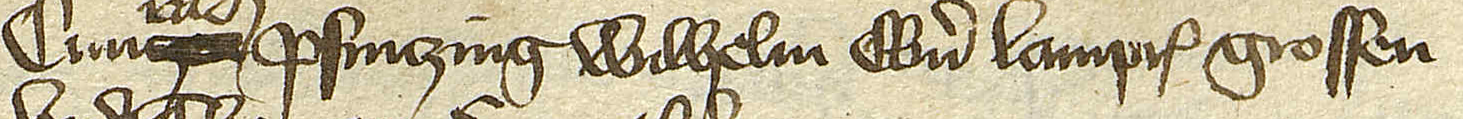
Cuncʒen Pfincʒing Wilhelm Ebn* lampr* groſſen
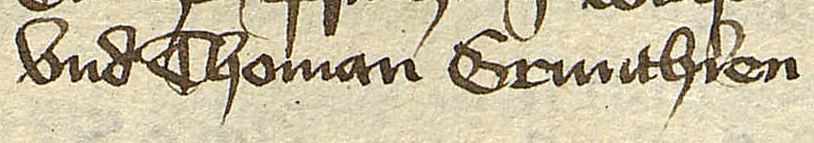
vnd Thoman Grunthr*en
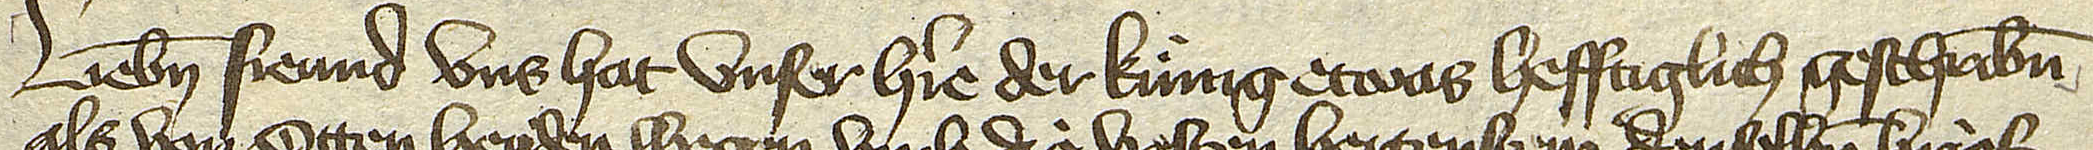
Liebn* freund vns hat vnſer h*re der künig etwas hefftiglich geſchribn*
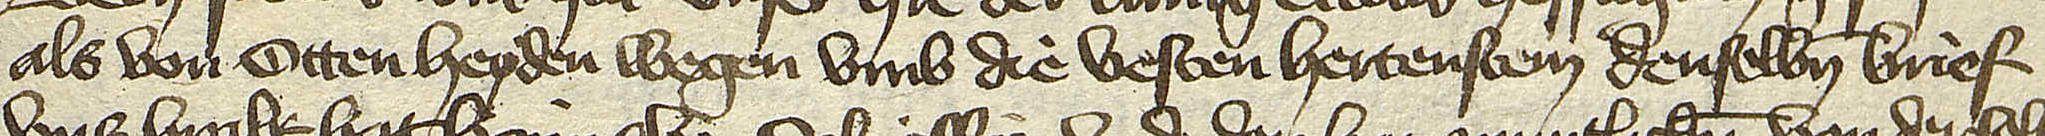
als von Otten heyden wegen vmb die veſten hertenſtein denſelbn* brief
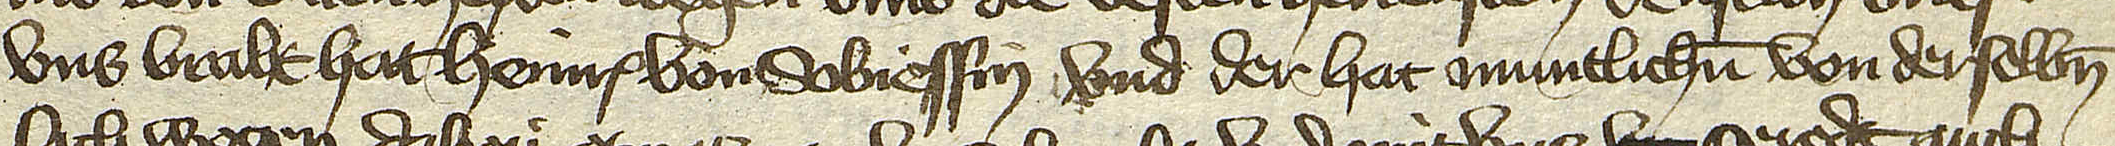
vns braht hat heinr* von Sobieſſin vnd der hat muntlichn* von derſelbn*
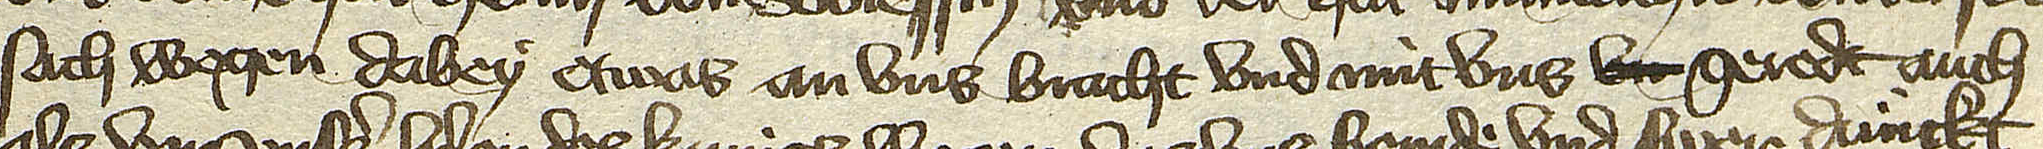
ſach wegen dabey etwas an vns bracht vnd mit vns vn geredt auch
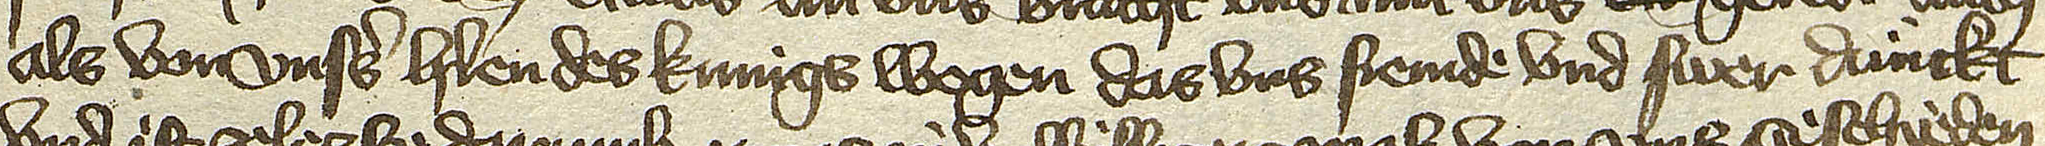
als von vnſs* hr*en des kunigs wegen das vns fremde vnd ſwer dünckt
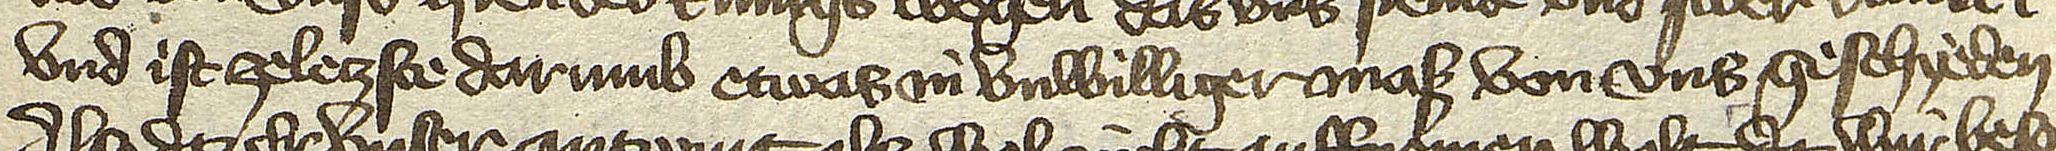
vnd iſt cʒelecʒſte darumb etwas in vnwilliger maſʒ von vns geſchyeden
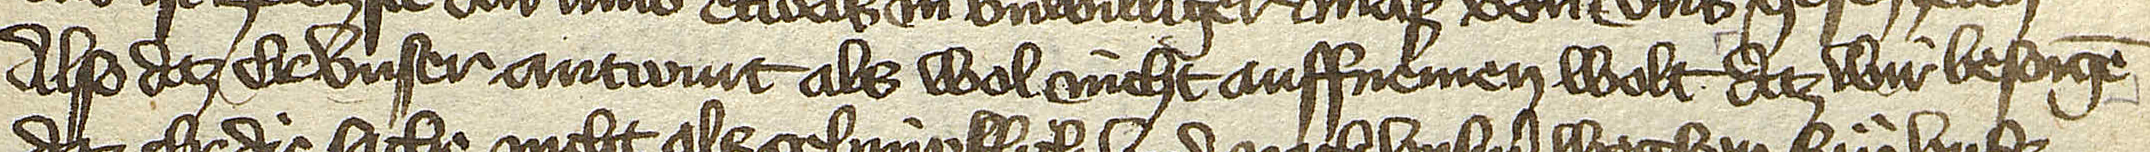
Alſo daʒ die vnſer antwurt als wol nicht auffnemen wolt daʒ wir beſorge*
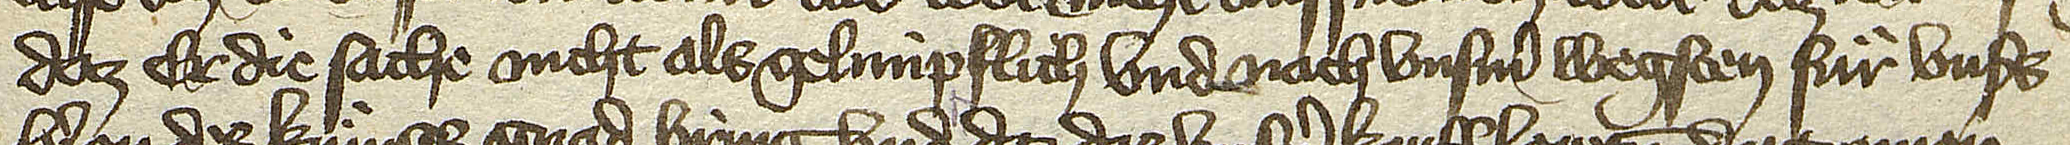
daʒ Er die ſache nicht als gelimpflich vnd nach vnſm* wegſten für vnſ*s
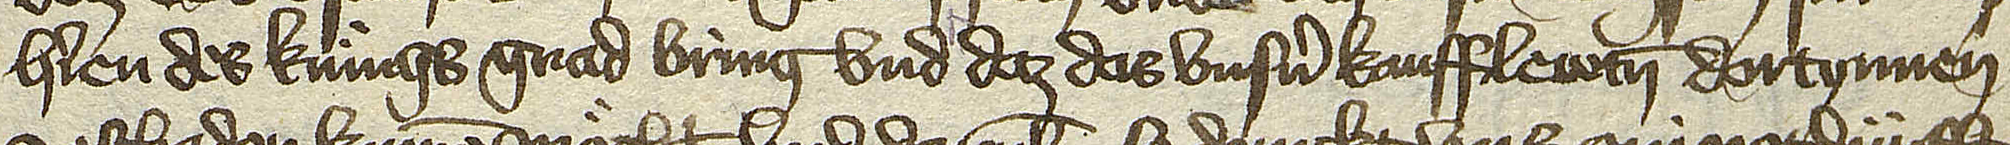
hr*en des künigs gnad bring vnd daʒ das vnſn* kaufflewtn* dortynnen
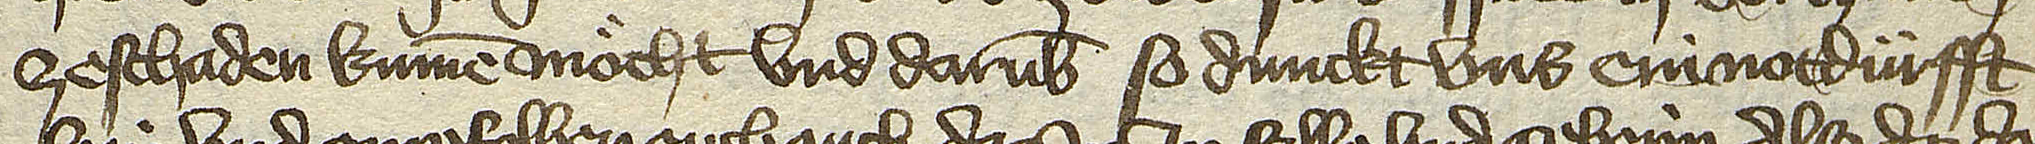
cʒeſchaden kume* möcht vnd darub* ſo dunckt vns ein notdürfft
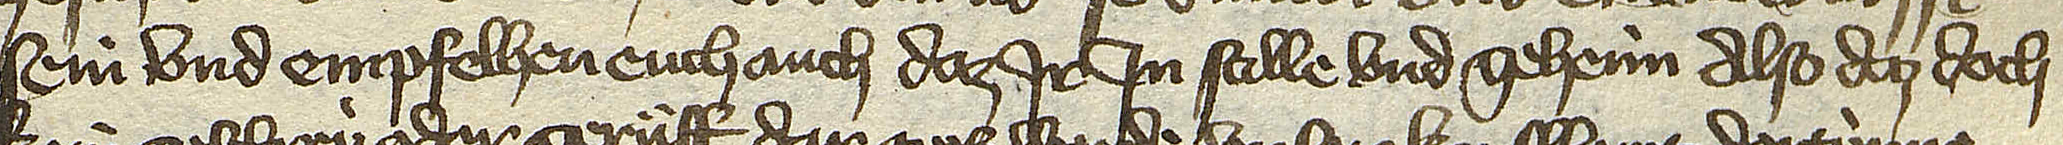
ſein vnd empfelhen euch auch daʒ Ir In ſtille vnd geheim Alſo daʒ doch
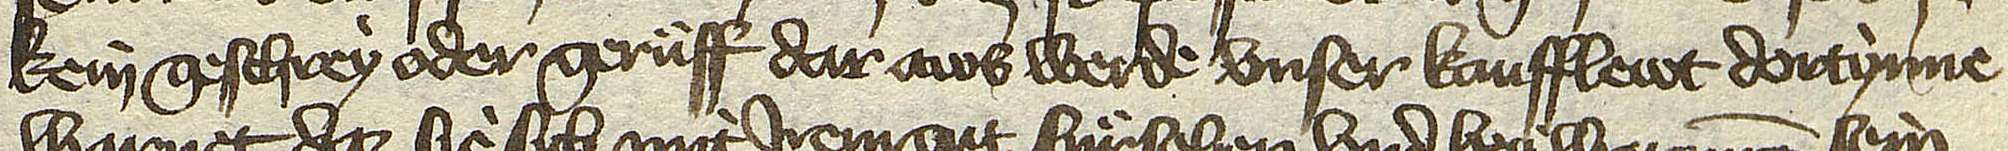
kein geſchrey oder gerüff dar aws werde vnſer kaufflewt dortynne
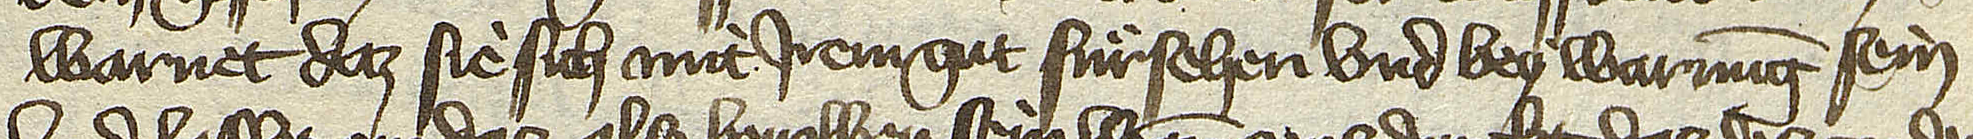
warnet daʒ ſie ſich mit Irem gut fürſehen vnd bey warnug* ſein
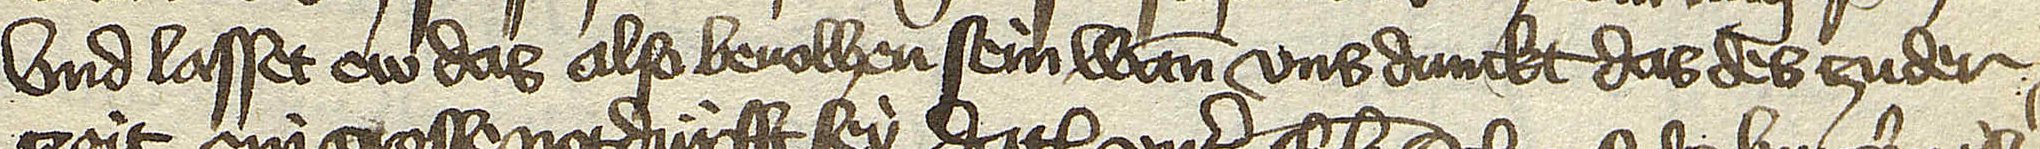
vnd laſſet ew das alſo beuolhen ſein wan* vns dunkt das des cʒu der
